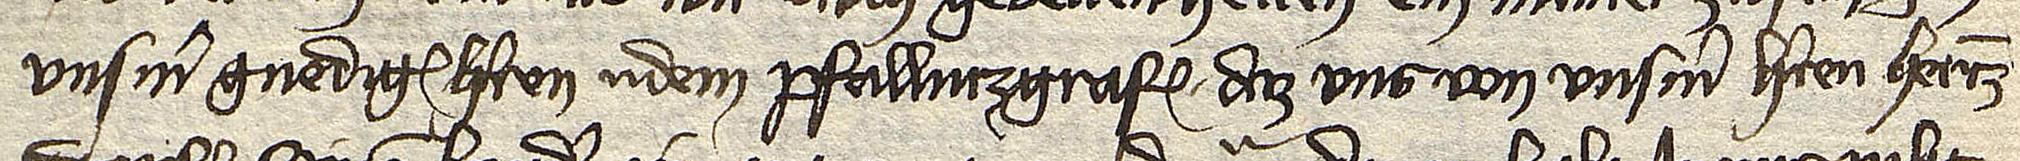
vnſm* gnedig* h*ren ~ dem Pfallncʒgraf* / daʒ vns von vnſm* h*ren hercʒ*
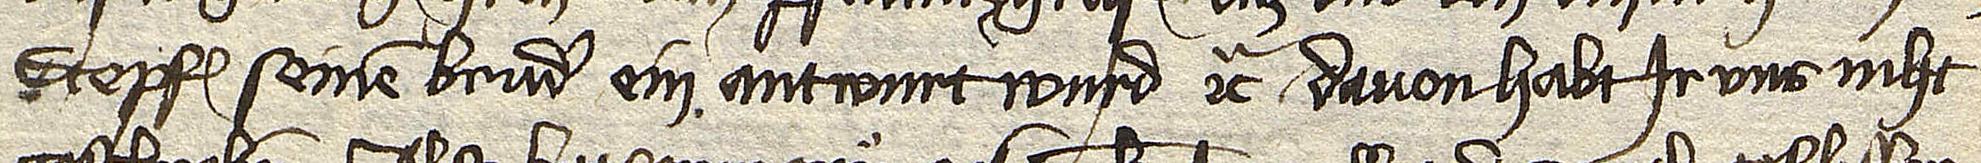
Stepf* ſeine* brud* ein antwurt wurd ec* / dauon habt Ir vns niht
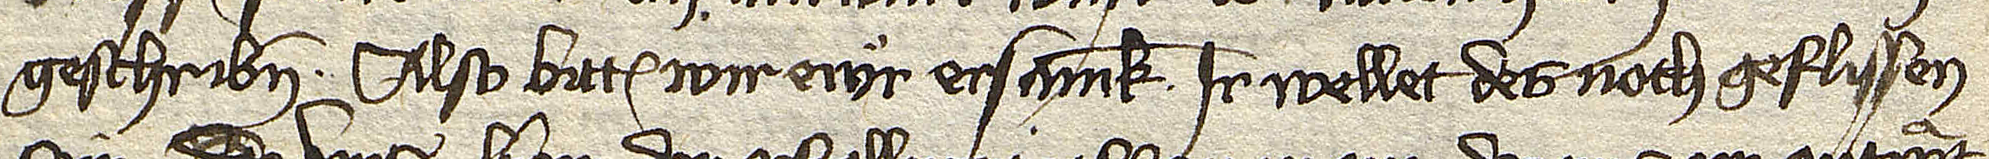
geſchribn* . Alſo bitt* wir eẅr erſamk* . Ir wellet des noch gefliſſen
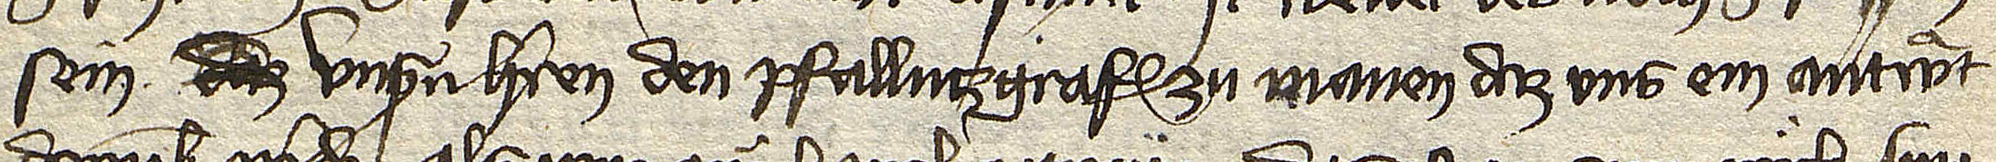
ſein . daʒ vnſ*n h*ren den pfallncʒgraf* ʒu manen daʒ vns ein antw*t
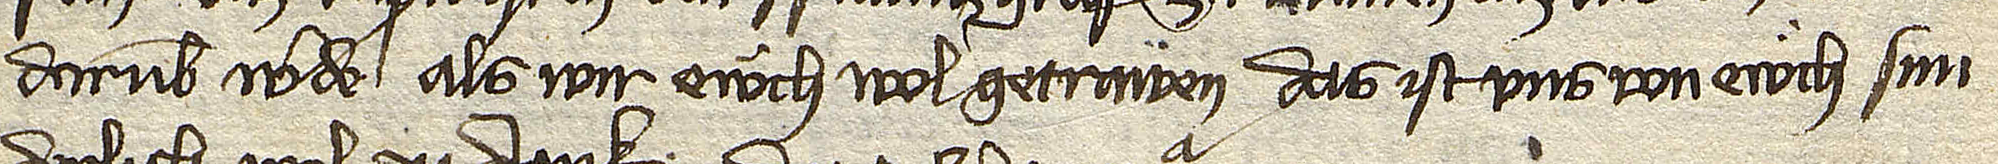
darub* w*de als wir eẅch wol getraẅen das iſt vns von eẅch ſun
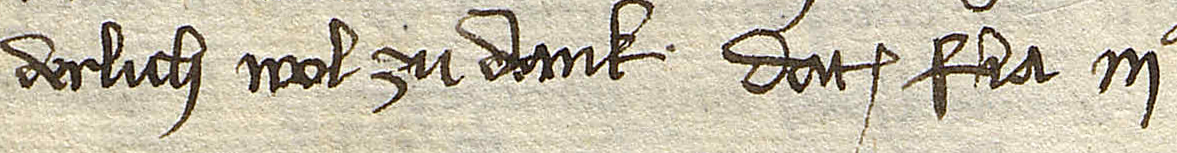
derlich wol ʒu dank dat* fi*a iii*
